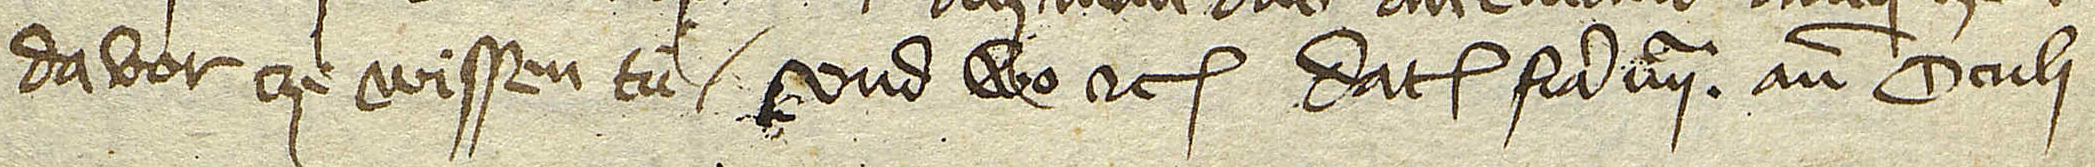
davor cʒe wiſſen tü / vnd wo ec* Dat* fia* iiii* . an* Oculi
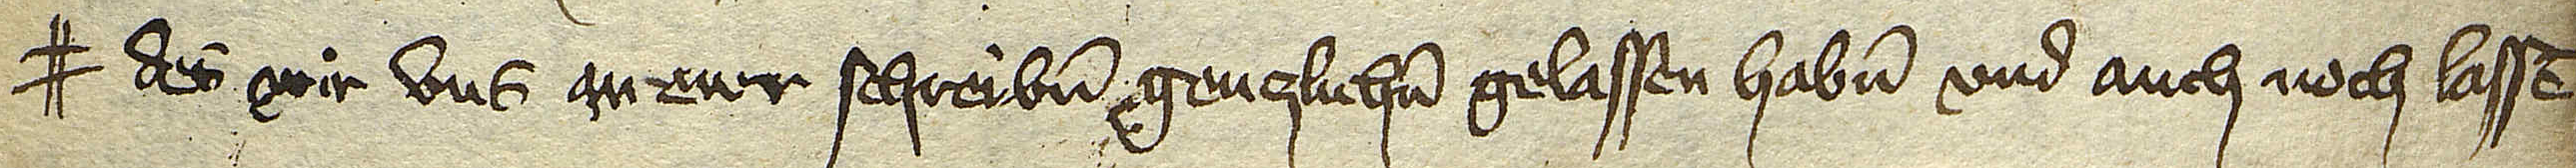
des wir vns an ewr ſchreibn* gencʒlichn* gelaſſen habn* vnd auch noch laſſe*
